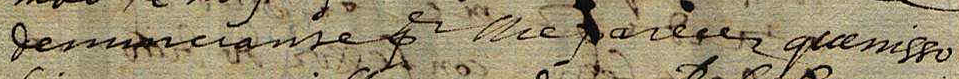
denunciante por lhe parecer que nisso
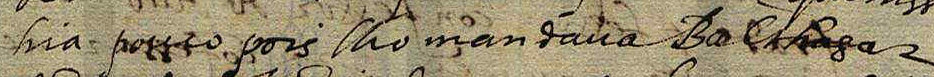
hia pouco pois lho mandaua Balthasar
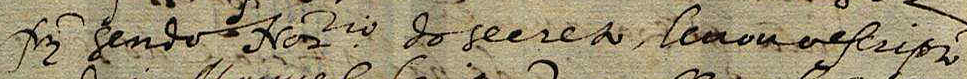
frz̄ sendo Notro. do secreto, leuou o escripto
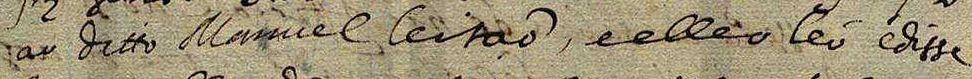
ao ditto Manuel leitaõ, e elle o leo e disse
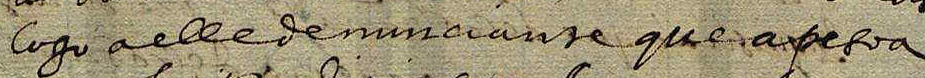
logo a elle denunciante que a pesoa
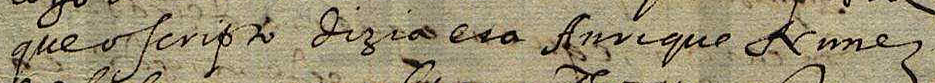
que o scripto dizia era Anrique Nunez
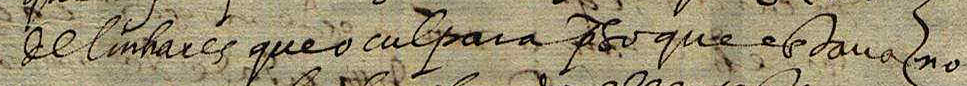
de linhares que o culpara p̄lo que estaua no
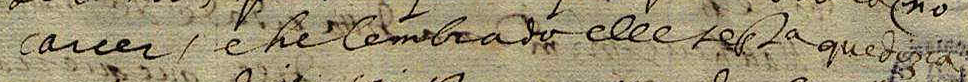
carcer / e he lembrado elle testa que dizia
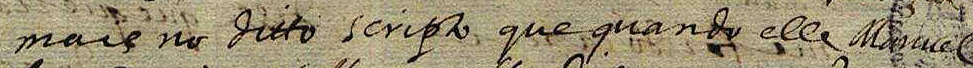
mais no ditto scripto que quando elle Manuel
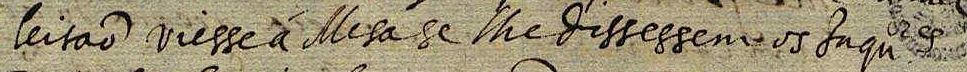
leitaõ viesse á Mesa se lhe dissessem os Inquores
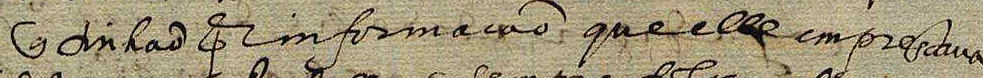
q̄ tinhaõ por informaçaõ que elle emprestaua
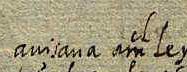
auisaua a mel Ley
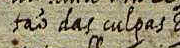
taõ das culpas q̄
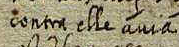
contra elle auia
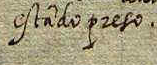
estādo preso.
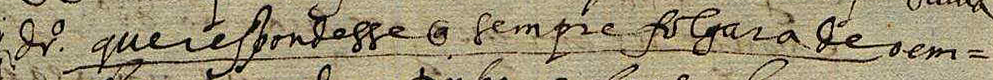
dr.o que respondesse q̄ sempre folgara de o em
